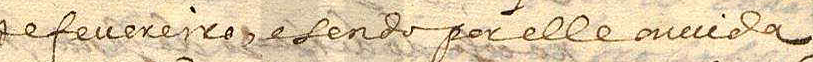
de feuereiro, e sendo por elle ouuida
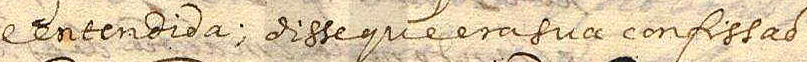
e entendida; disse que era sua confissaõ
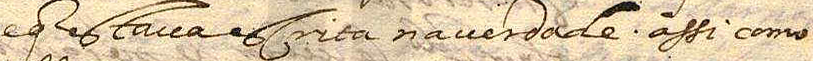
e q̄ estaua esCrita na uerdade assi como
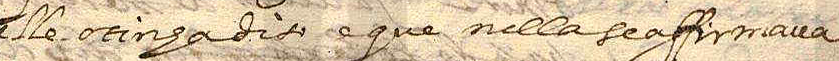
elle o tinha dito o que nella se affirmaua
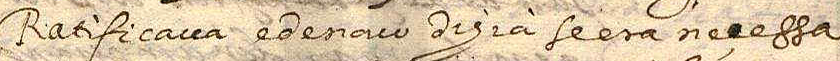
Ratificaua e de nouo dizia se era necessa
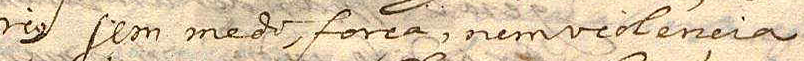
rio sem medo, força, nem violencia
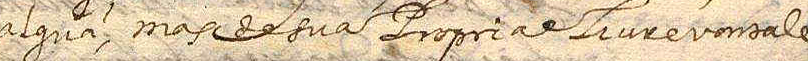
alguā, mas de sua Propria e Liure vontade
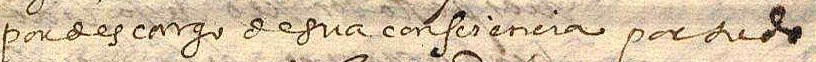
por descargo de sua consciencia por tudo
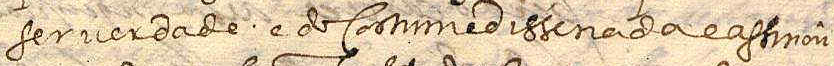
ser uerdade e do Costume disse nada e assinou
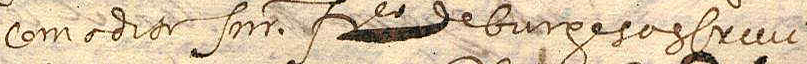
com o dito Snr̄ frco de burges o esCreui
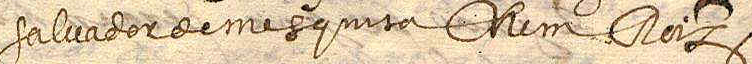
saluador de mesquita Mem Roiz̄
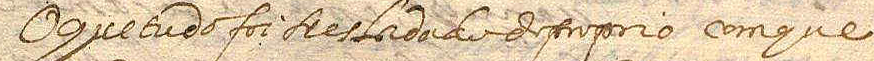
O que tudo foi tresladado do proprio com que
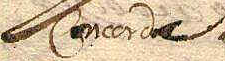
Concorda
